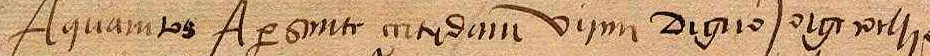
A quamtos A ꝑsemte certydam virem diguo Jorge coelho
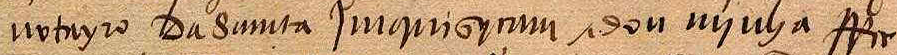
notayro da Samta Jmquisyçam e dou mjnha ffee
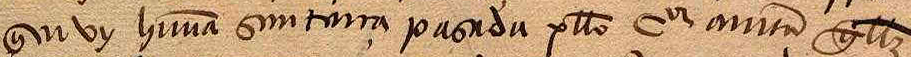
q̄ eu vy huūa semtença pasada pl̄lo Cor amtā gl̄lz
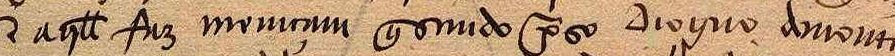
ē a q̄ll faz memçam q̄ semdo p̄so Dioguo de mote
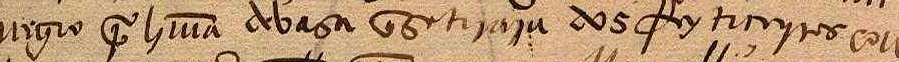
negro p̄o hūua devasa q̄ se tirara dos feyticeyros e ou
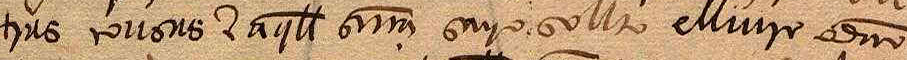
tras cousas ē a q̄ll sn̄ça sayo sollto e lliure o dito
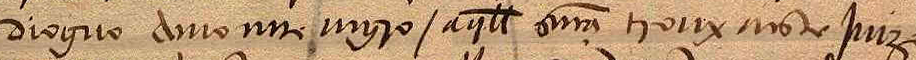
dioguo de momtenegro / a q̄ll sn̄ça troux a este Juizo
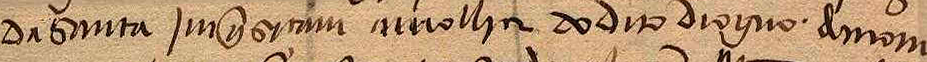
Da Santa Jmq̄syçam a molher do dito dioguo de mom
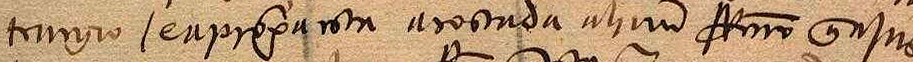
tenegro / e a prop̄a esta acostada a huū ffecto q̄ a Jus
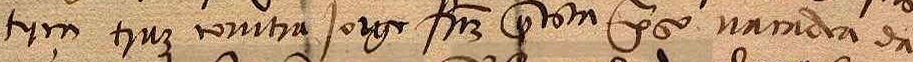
tyça traz comtra Jorge fr̄rz q̄ esta p̄so na cadea da
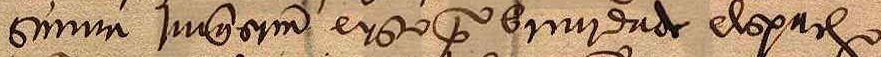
samta Jmq̄syçā e ysto p̄o breujdade e despacho
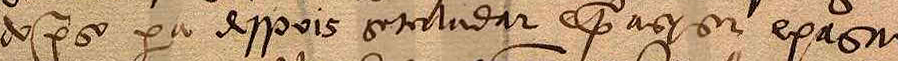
do p̄so ꝑa despois se terladar e p̄o asy ser e pasar
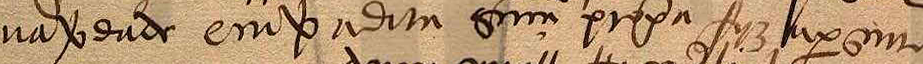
na ꝟdade e eu ꝟ a dita sn̄ça prop̄a fyz a ꝑsente
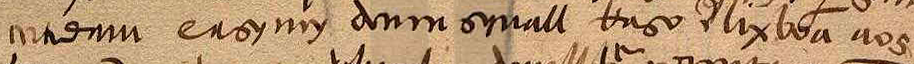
certidam e asyney de meu synall Raso ē lixboa aos
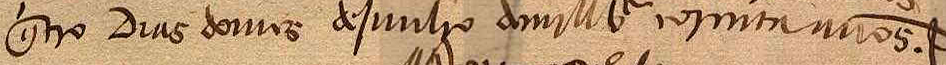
q̄tro Dias do mes de Junho de mjll vc corenta anōs.
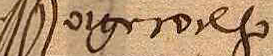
Jorge coelho
